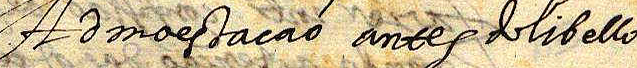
Admoestacaõ antes do libello
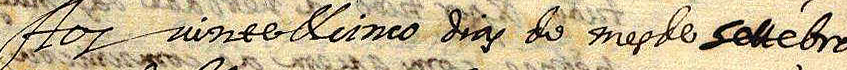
Aos uinte & cinco dias do mes de settēbro
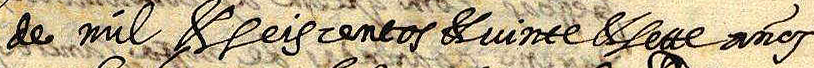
de mil & seiscentos & uinte & sette an̄os
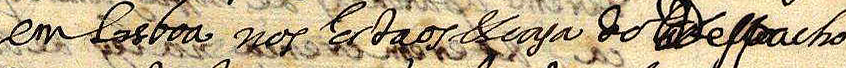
em Lisboa nos Estaos & casa do Despacho
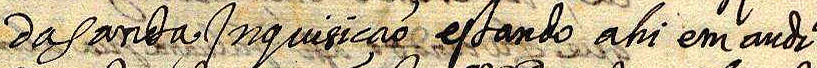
da sancta Jnquisiçaõ estando ahi em audia
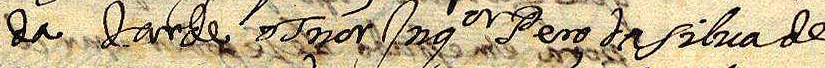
da tarde o snor̄ Jnqor Pero da silua de
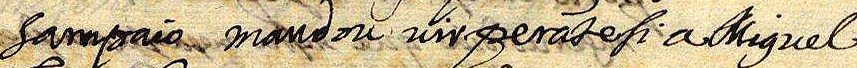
sampaio mandou uir perāte si a Miguel
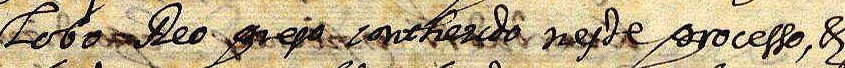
Lobo Reo preso contheudo neste processo, &
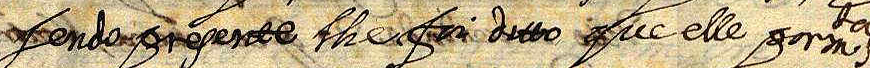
sendo presente lhe foi ditto que elle por m.tas
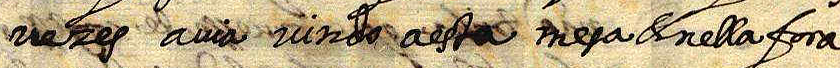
uezes auia uindo a esta mesa & nella fora
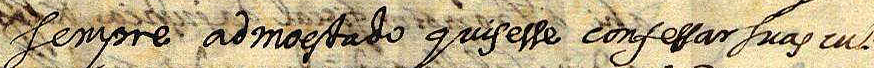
sempre admoestado quisesse confessar suas cul
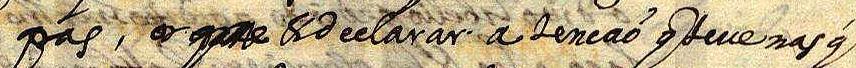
pas, o que & declarar a tençaõ q̄ teue nas q̄
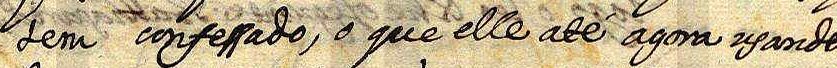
tem confessado, o que elle até agora usando
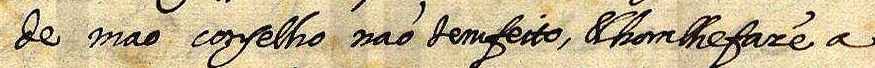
de mao conselho naõ tem feito, & hora lhe fazē a
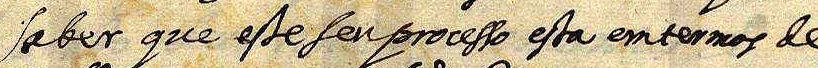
saber que este seu processo esta em termos de
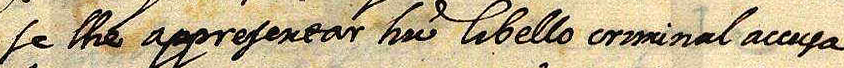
se lhe appresentar hū libello criminal accusa
